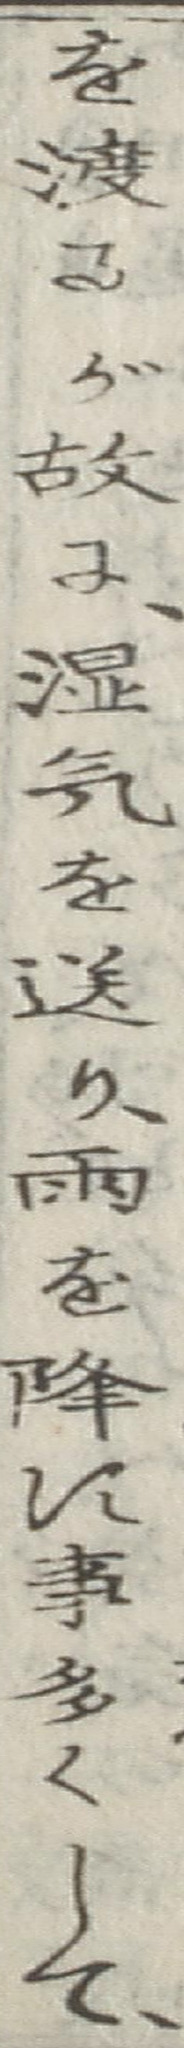を渡るが故に、湿気を送り、雨を降す事多くして、
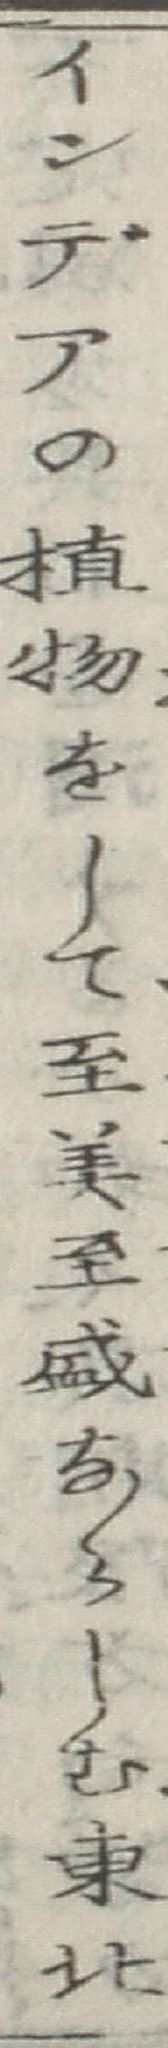インデアの植物をして、至美至盛ならしむ、東北
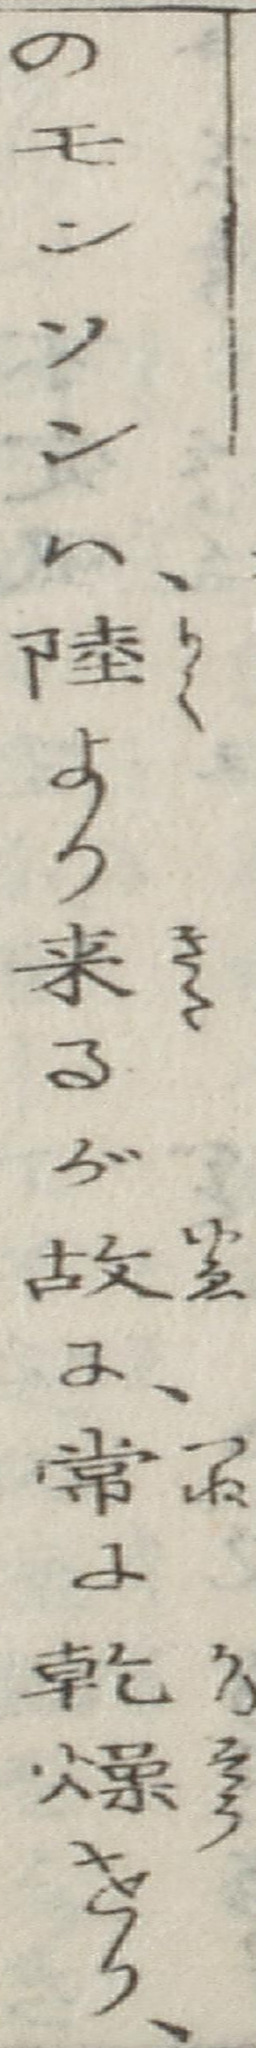のモンソンは、陸より来るが故に、常に乾燥せり、
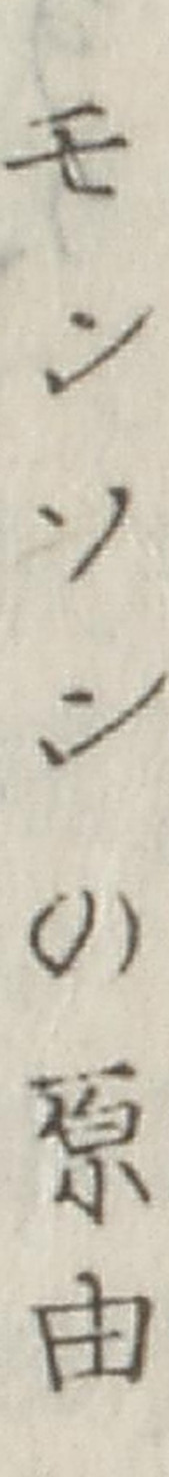モンソンの原由
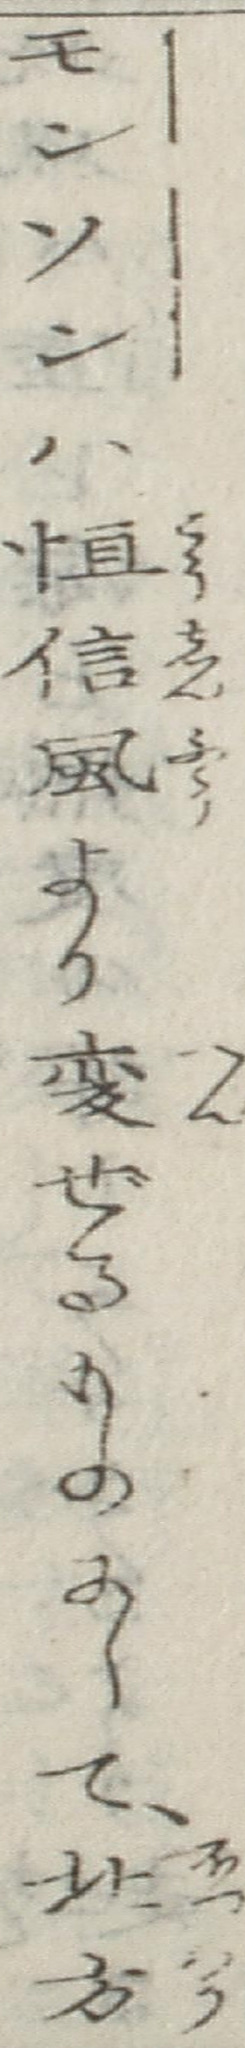モンソンは恒信風より変ぜるものにして、北方
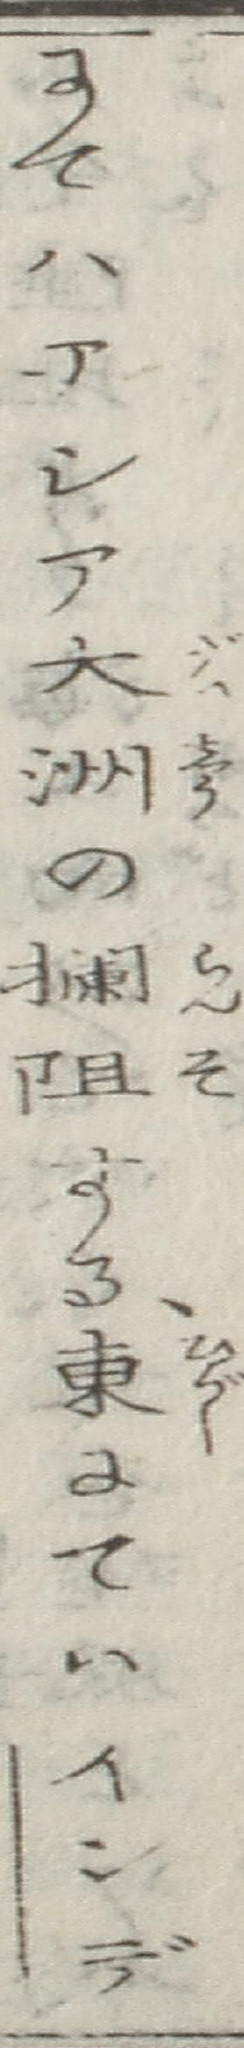にてはアシア大洲の攔阻する、東にてはインデ
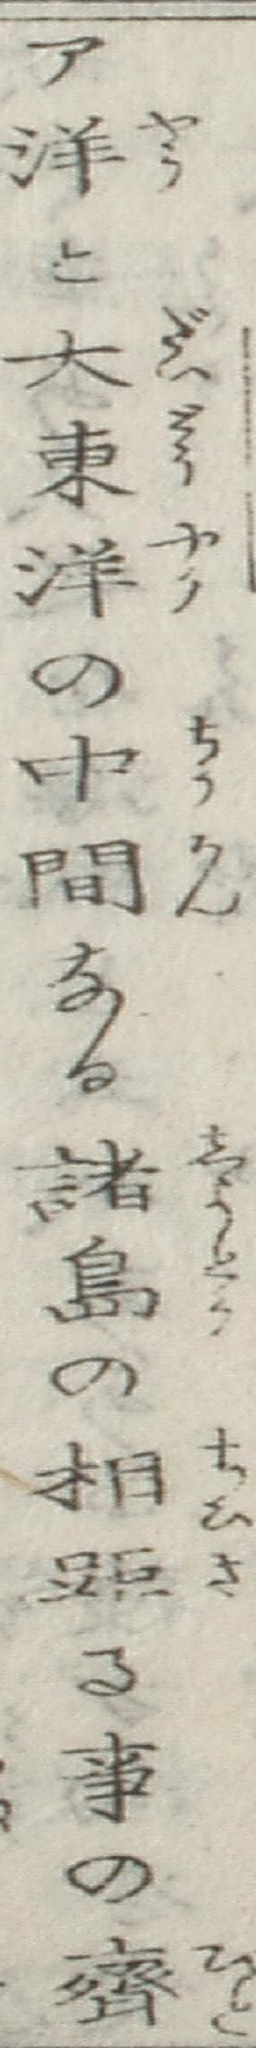ア洋と大東洋の中間なる諸島の相距る事の斉
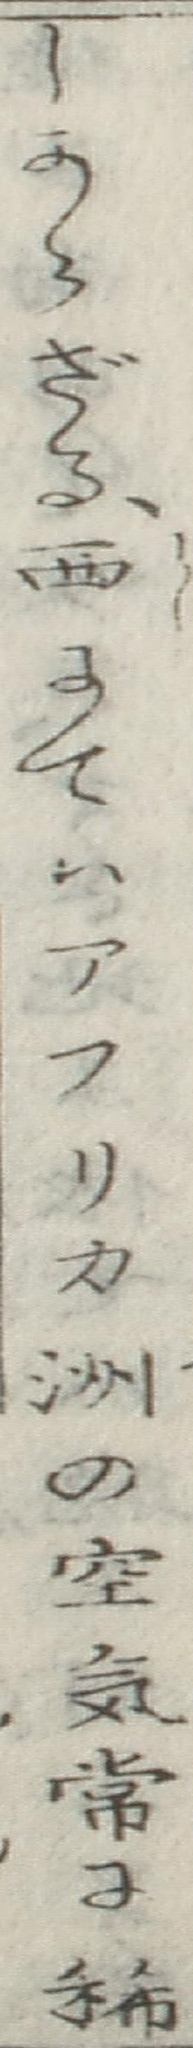しからざる、西にてはアフリカ洲の空気常に稀
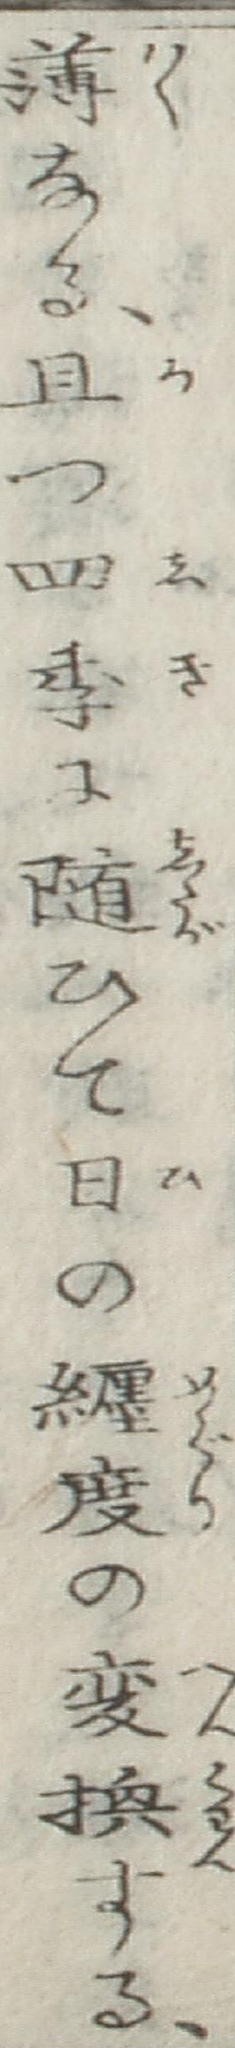薄なる、且つ四季に随ひて日の纏度の変換する、
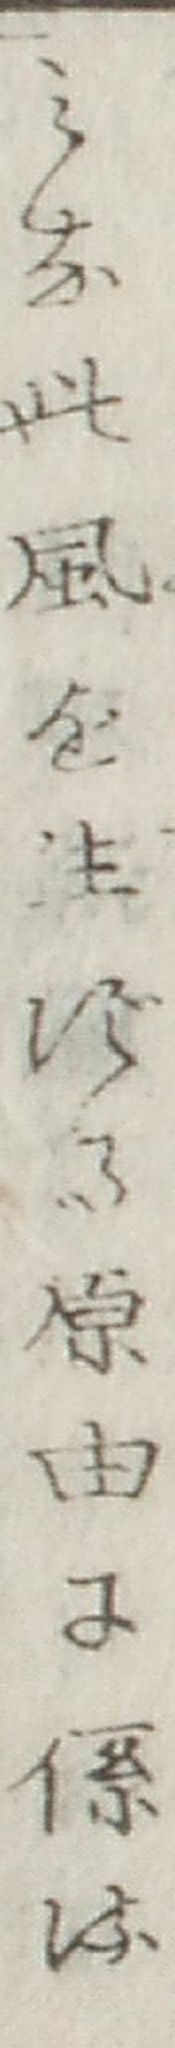みな此風を生ずる原由に係る、

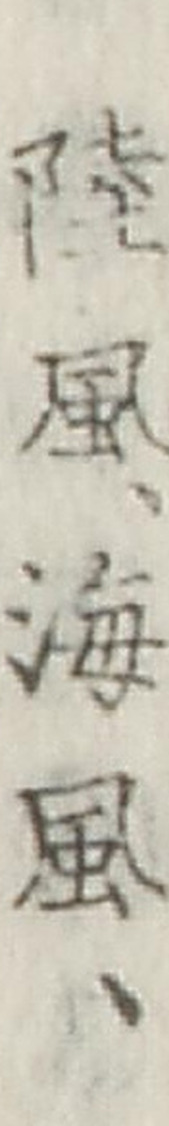陸風、海風、
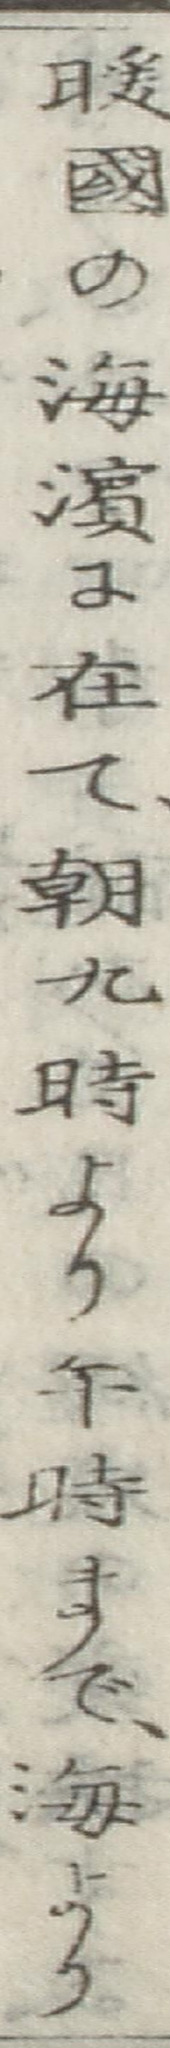暖国の海浜に在て、朝九時より午時まで、海より
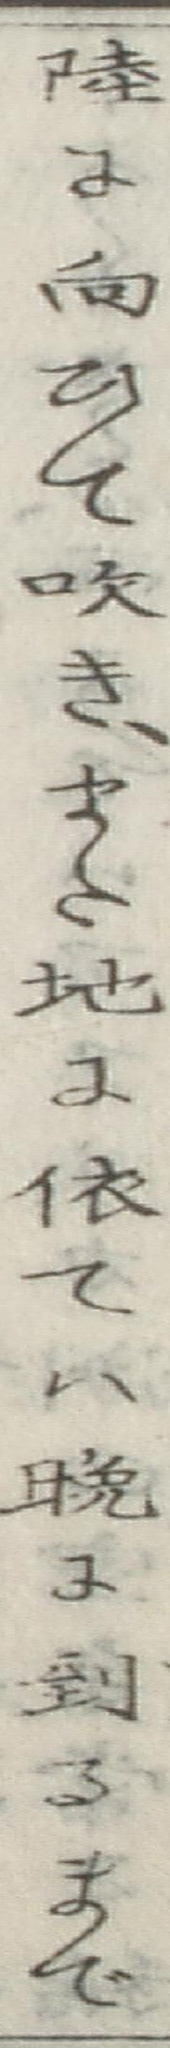陸に向ひて吹き、また地に依ては晩に到るまで
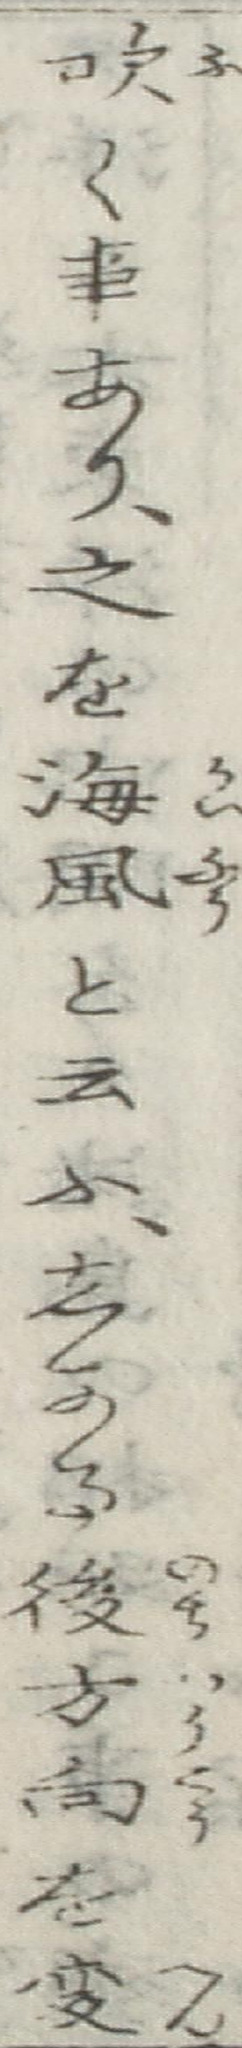吹く事あり、之を海風と云ふ、しかる後方向を変
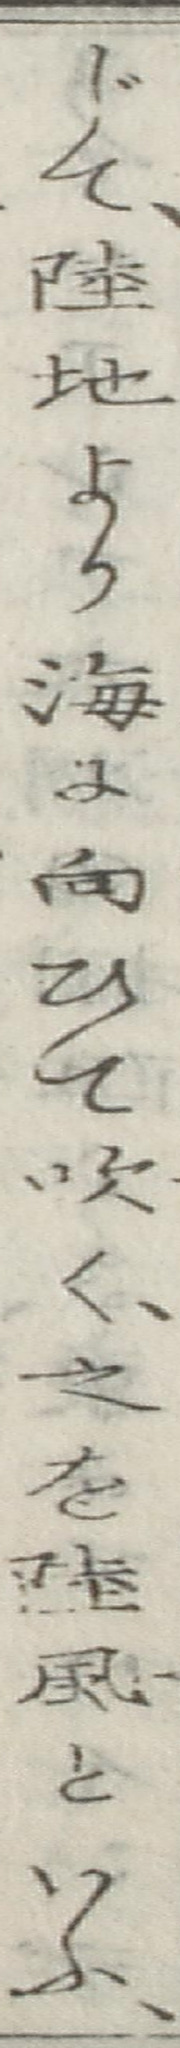じて、陸地より海に向ひて吹く、之を陸風といふ、
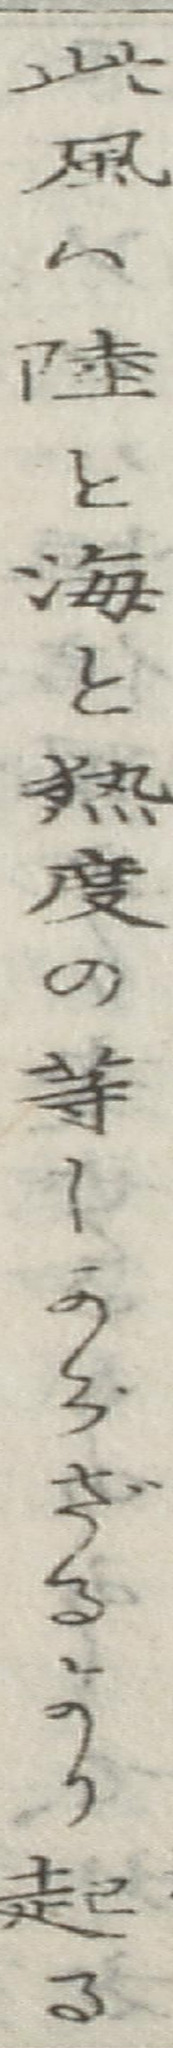此風は陸と海と熱度の等しからざるより起る
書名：訓蒙　天然地理學　中
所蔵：東京大学地震研究所図書室 Earthquake Research Institute Library, The University of Tokyo, JAPAN
